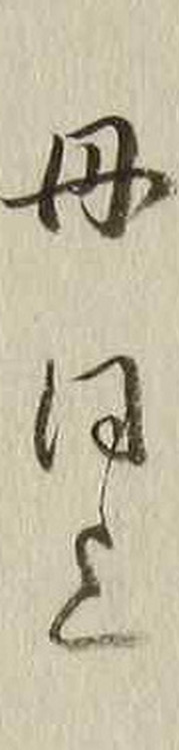母同上
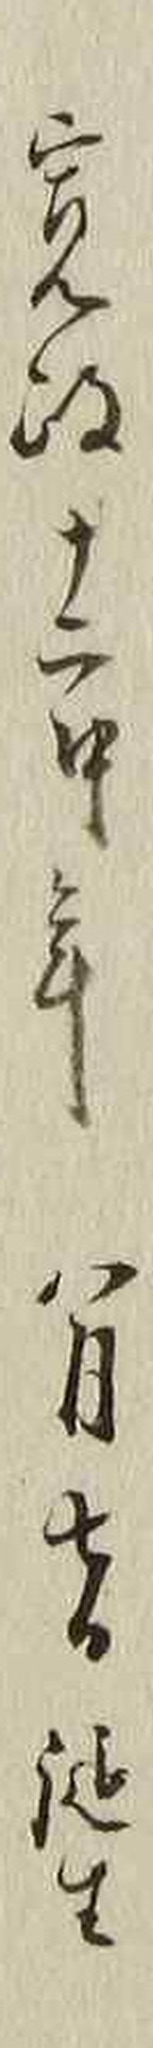寛政四子年八月十七日誕生
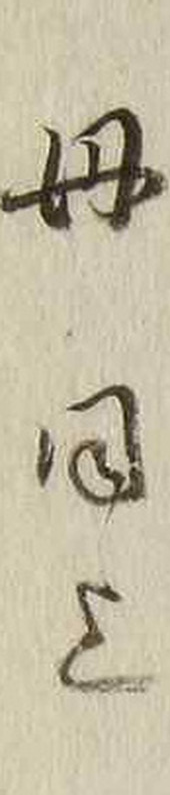母同上
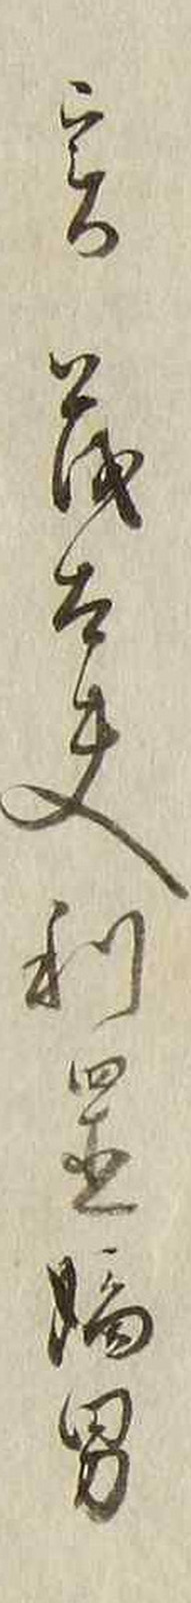実茂太夫利置嫡男

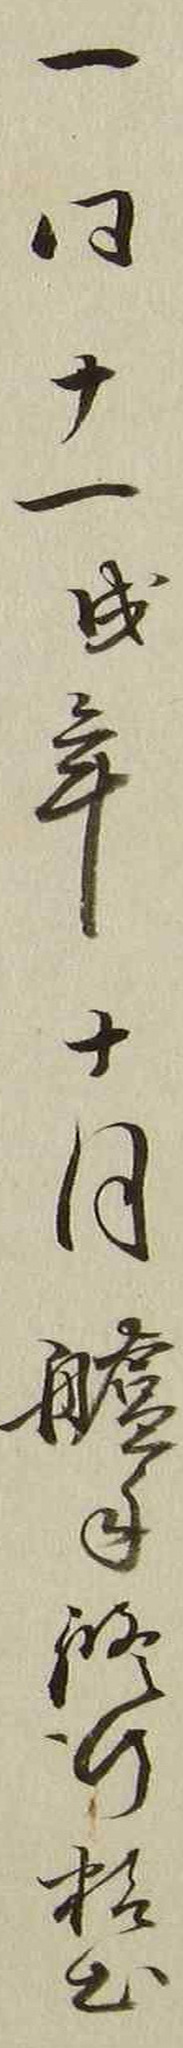一同十一戌年十月艪手修行精出し
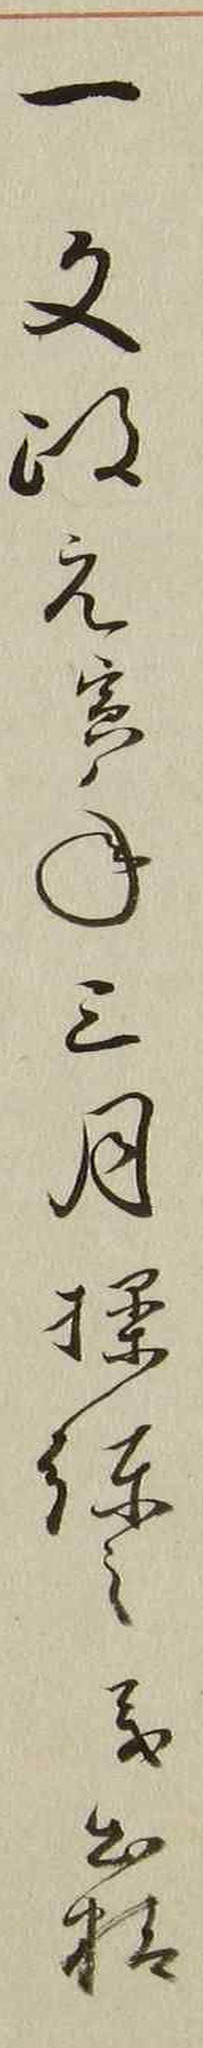一文政元寅年三月操練之義出精
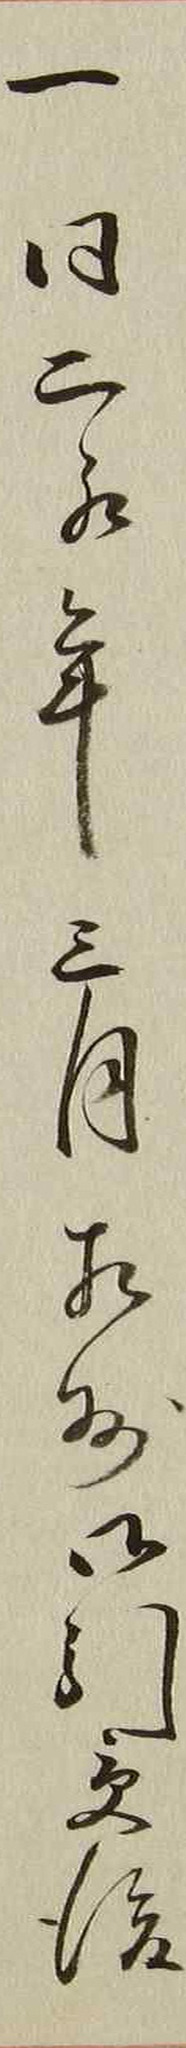一同二卯年三月相州御引受後
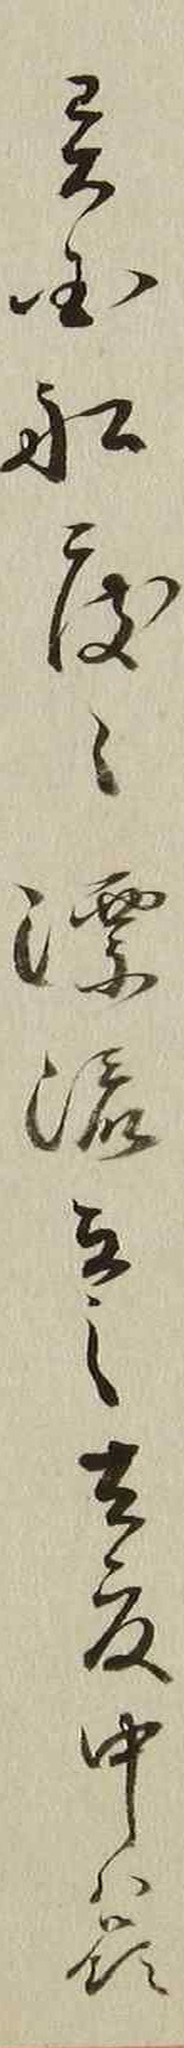異国船度々漂流之在り去夏中ㇵ御領
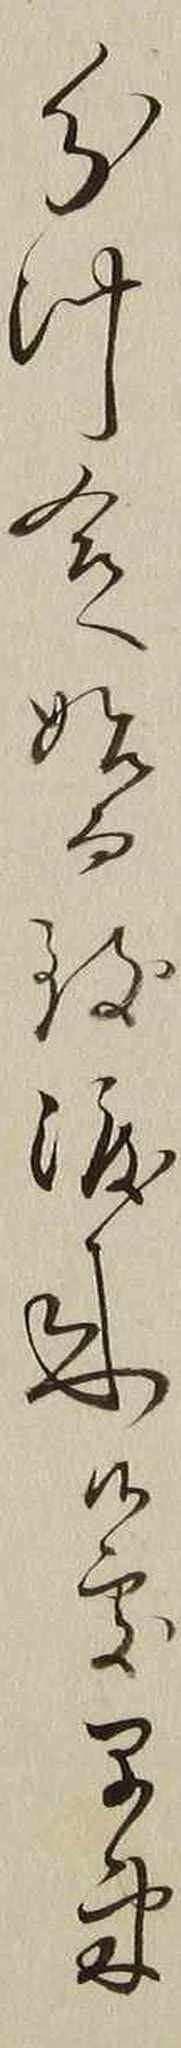分沖合へ始めて渡来致し候処早速
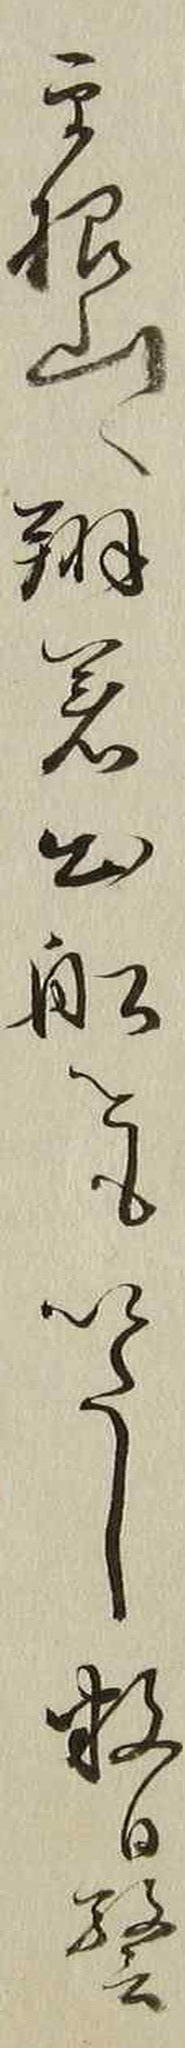曽根山へ着翔出船をもいたし数日警
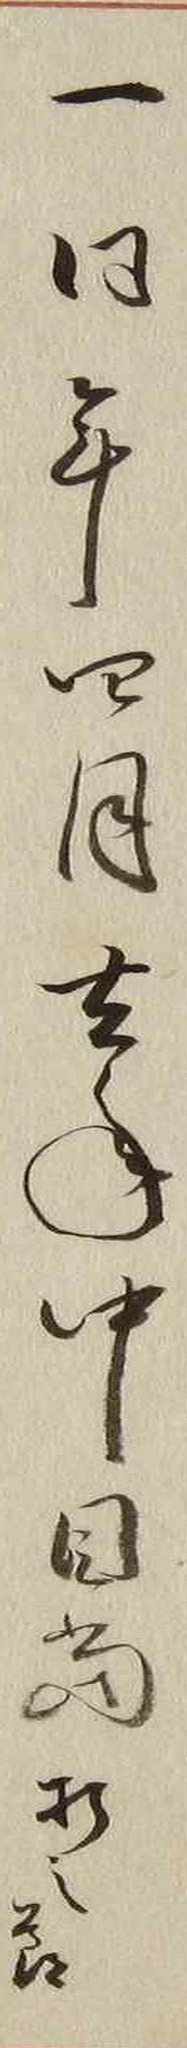一同年四月去年中目当打之節
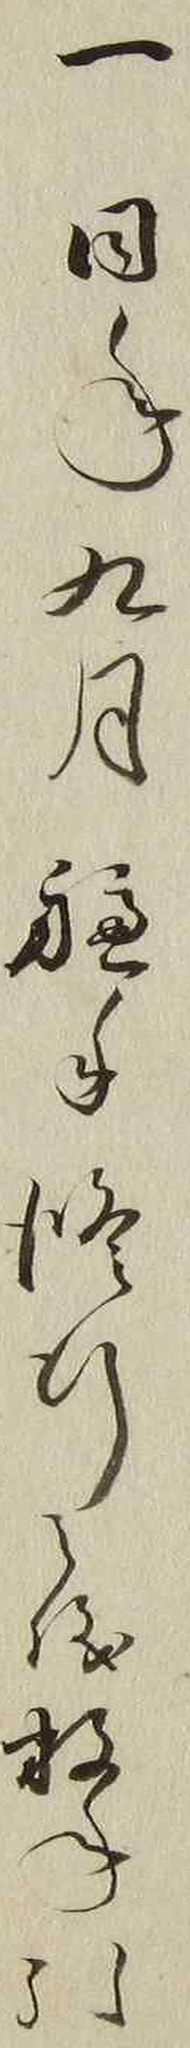一同年九月艪手修行之儀数年引
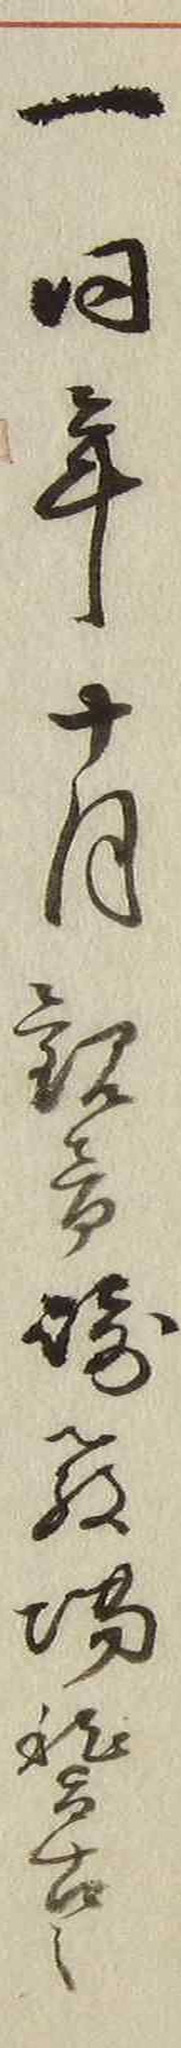一同年十月観音崎教場警固之
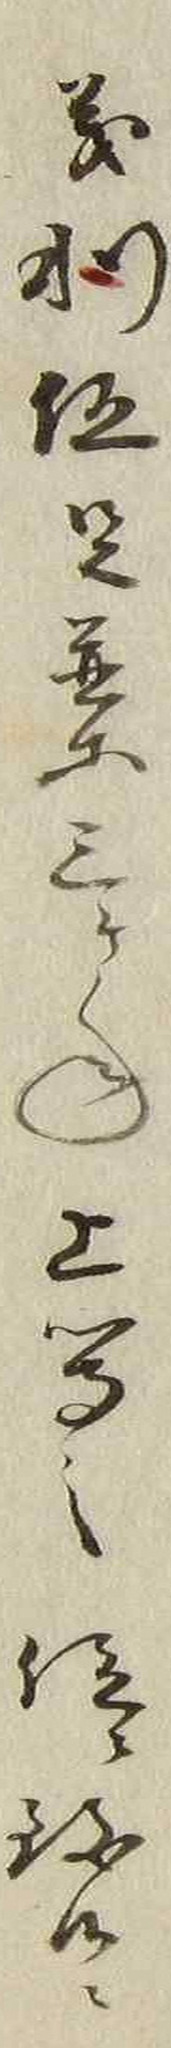義列伍足並等三ケ年上等之位ニ致し候ニ
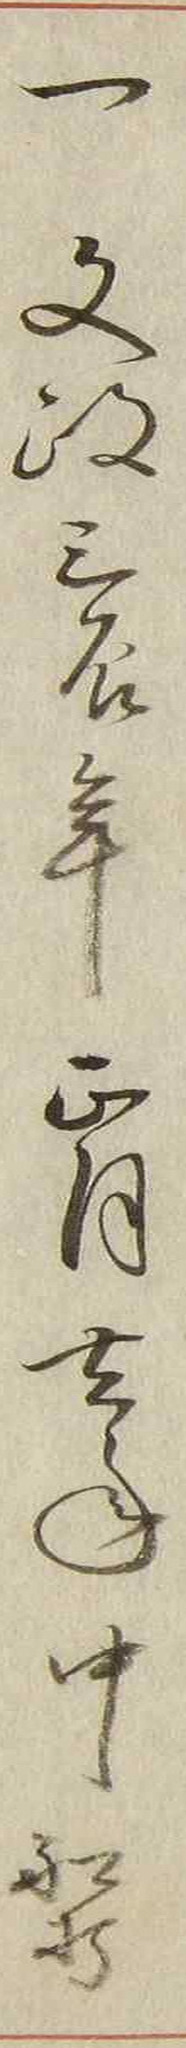一文政三辰年正月去年中船打

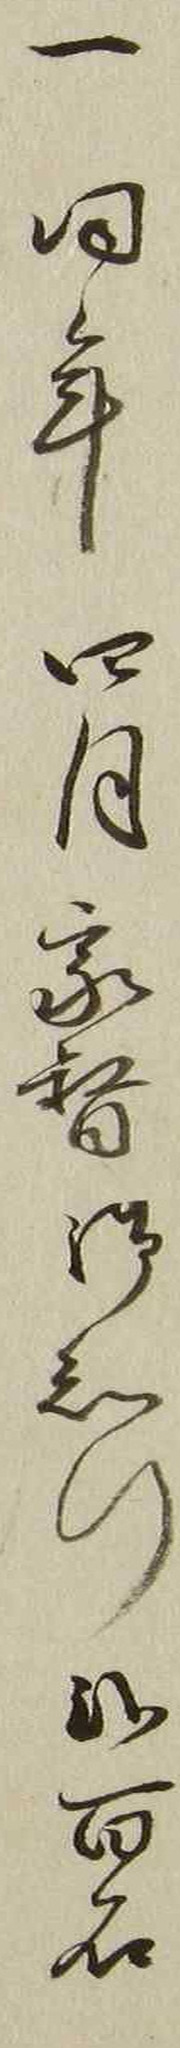一同年四月月家督御知行弐百石
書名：諸士系譜　巻之20　い之部20
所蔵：会津若松市立会津図書館
